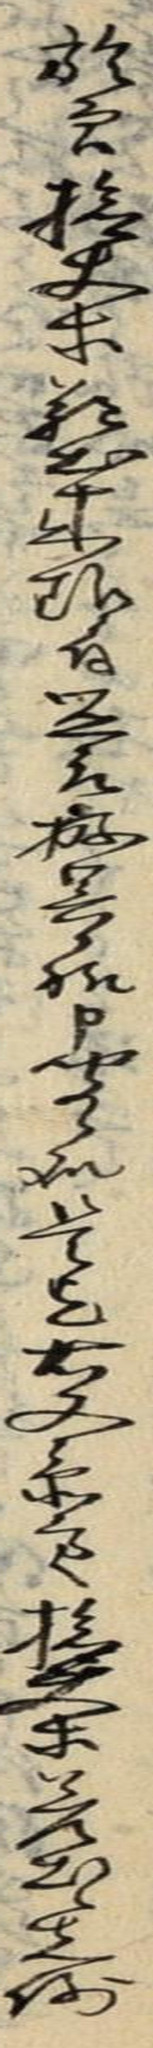於ては検使等難出来趣に付宜取扱呉候様申聞候処是迄右又兵衛方へ検使等差出候先例
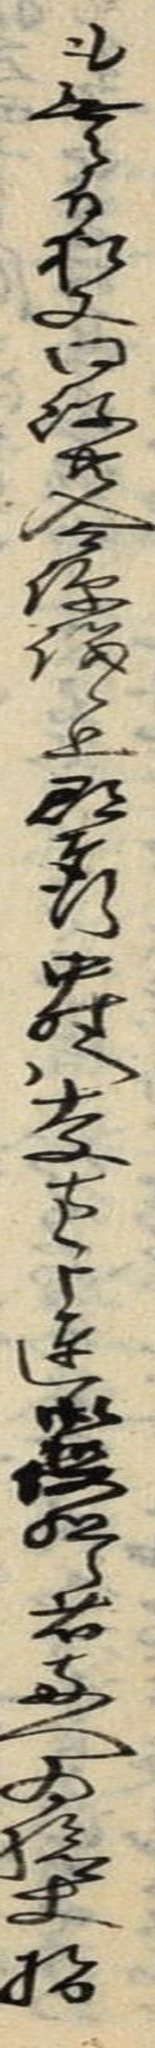も無之に付猶又同役共令評議候上郡奉行中村八大夫方へ申達御役組之者両人為検使指
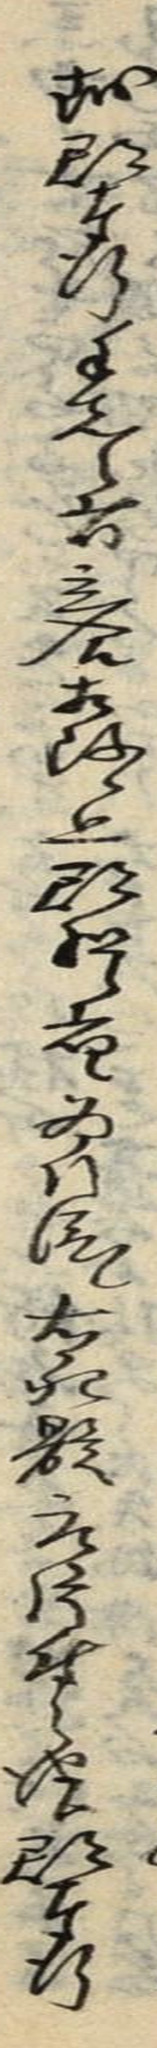越郡奉行手先之者立合相改候上郡組之者へ為引渡候右死骸取片付之儀は郡奉行
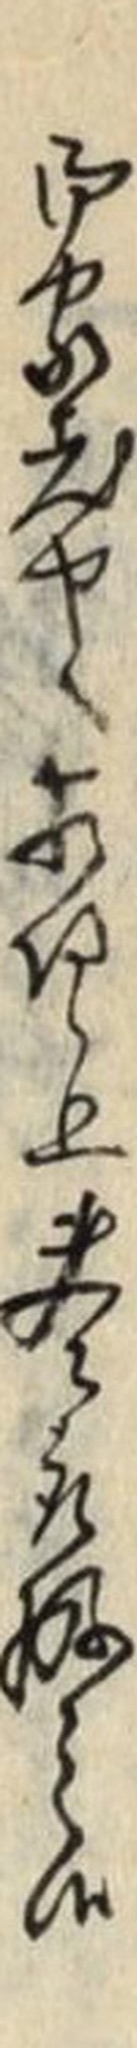御家老中へ相伺候上夫々取扱之候
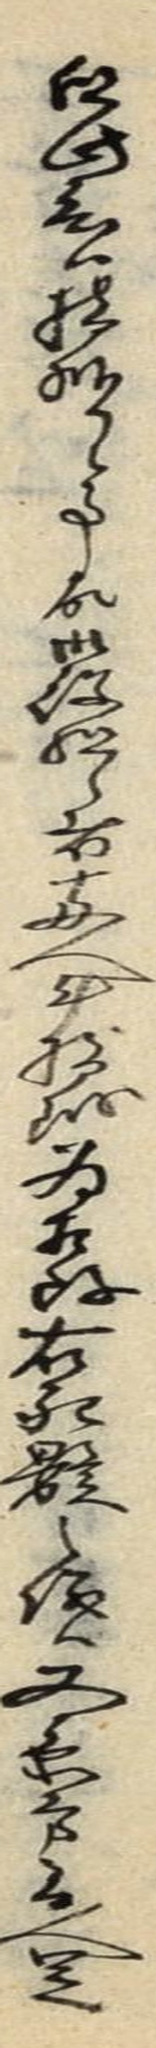但此度は指掛り候事故御役組之者両人斗指越為相改右死骸之儀は又兵衛方にて人足
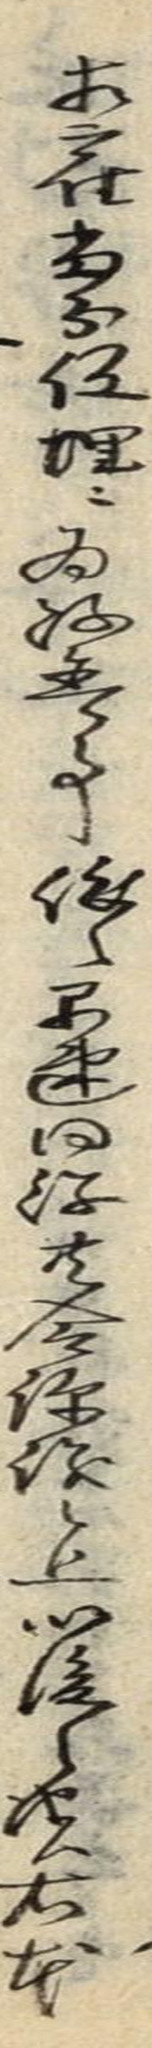相雇当分仮埋に為致置候事依之早速同役共令評議候上以後之儀は右本
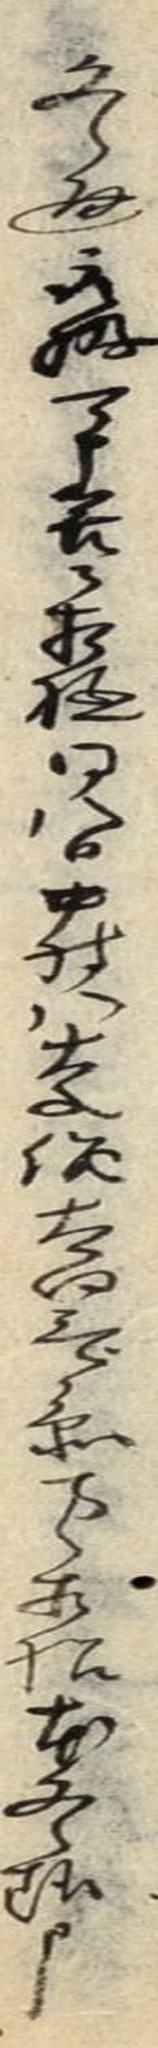文之通取扱可申筈に相極同八日中村八大夫儀太田三郎兵衛方へ相招本文之趣申
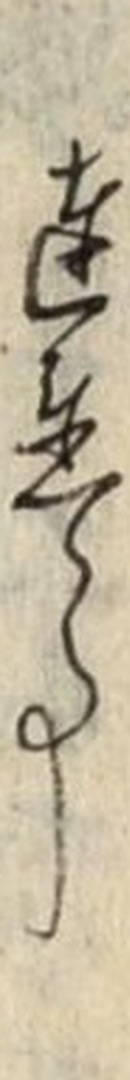達置候事
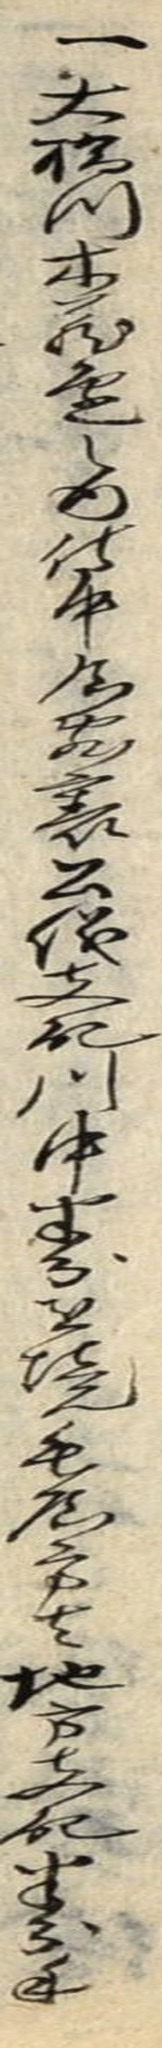一大橋川木蔵辺之内侍中屋敷裏公儀支配川中半分を境毛屋方は地方支配半分手
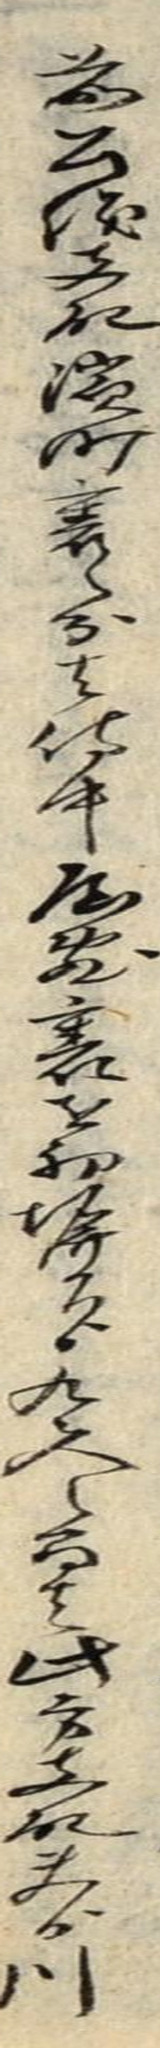前公儀支配浜町裏之分は侍中屋敷裏を初塀下ゟ九尺之間は此方支配夫ゟ川
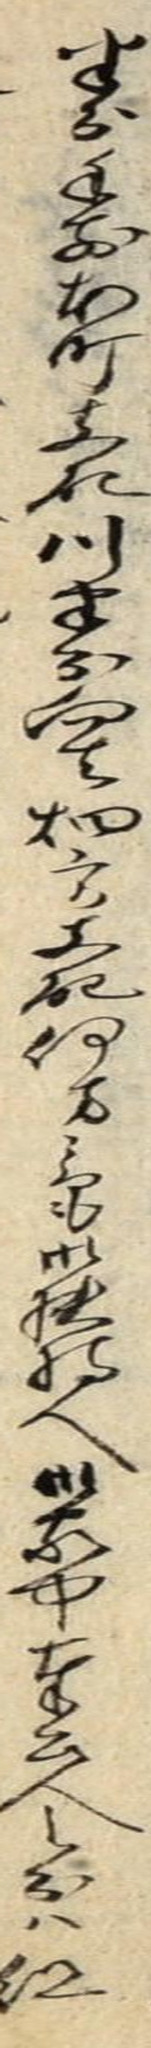半分手前本町支配川半分向は畑方支配何方にても御扶持人御家中奉公人之分は組
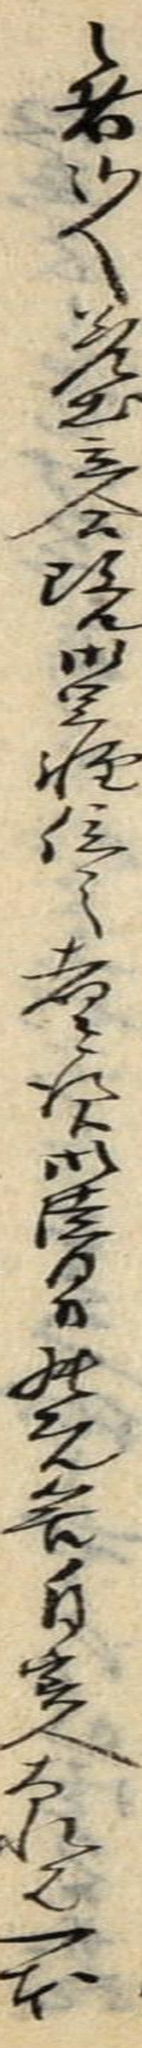之者弐人差出立合改ル御足軽位之者に候得は御徒目付罷出ル筈自害人なれは一本
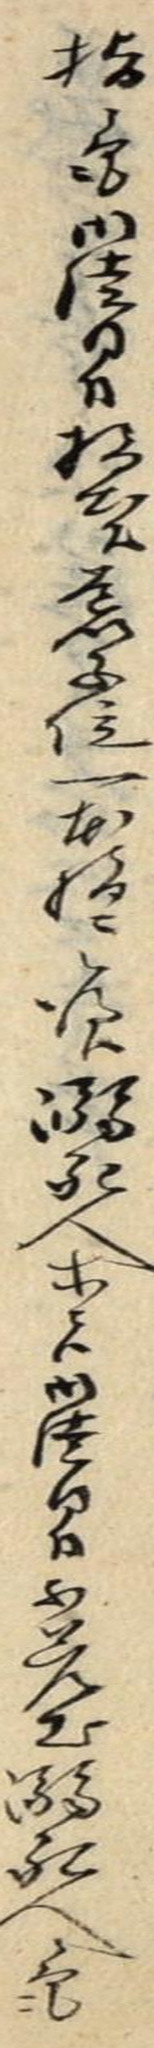指にても御徒目付指出ス荒子位一本指に候得は溺死人等には御徒目付不差出溺死人にても

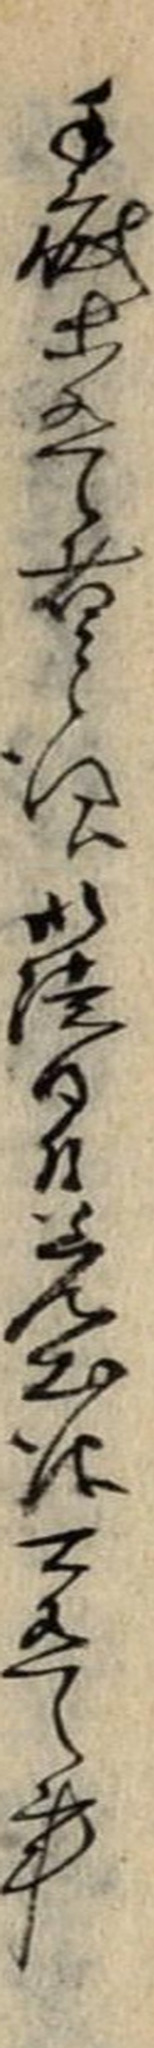手疵等有之者に候得は御徒目付差出儀可有之事
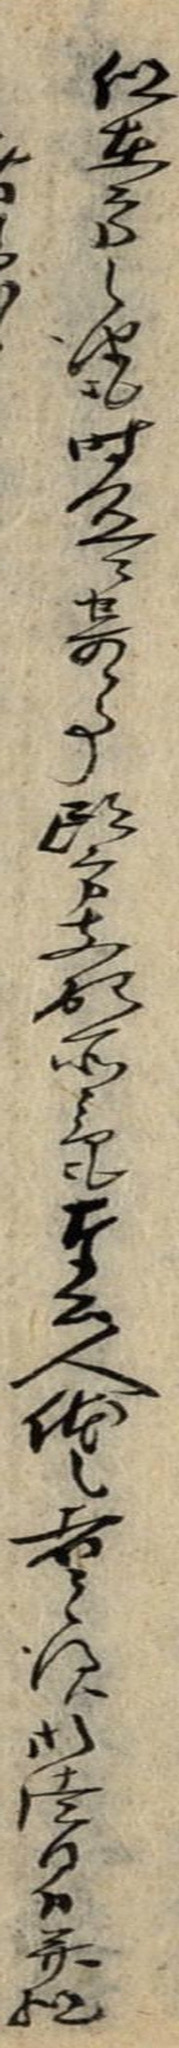但在方之儀も時宜に寄候事郡方支配所にても奉公人体之者に候得は御徒目付并組
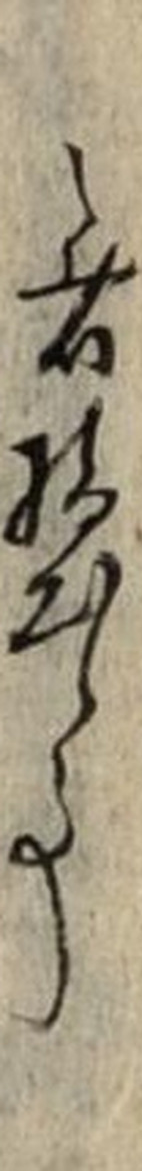之者指出候事
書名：御停止異変死失
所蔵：福井県文書館 Fukui Prefectural Archives
